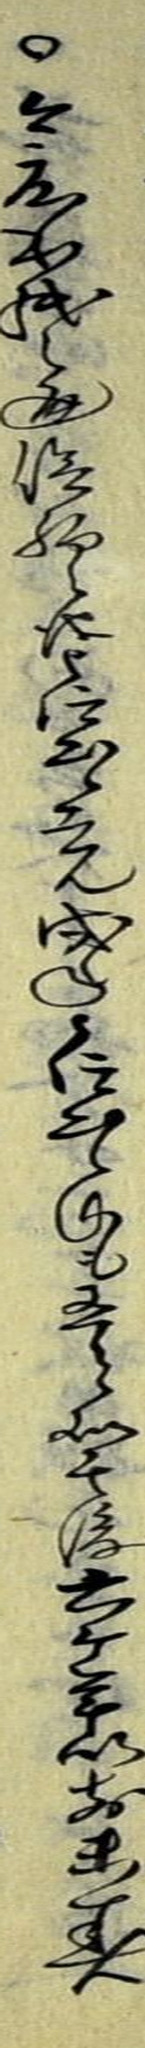〇今度本紙之通倹約之儀被仰出候去る戌年被仰出候趣も有之候処其後六ヶ年以前未春
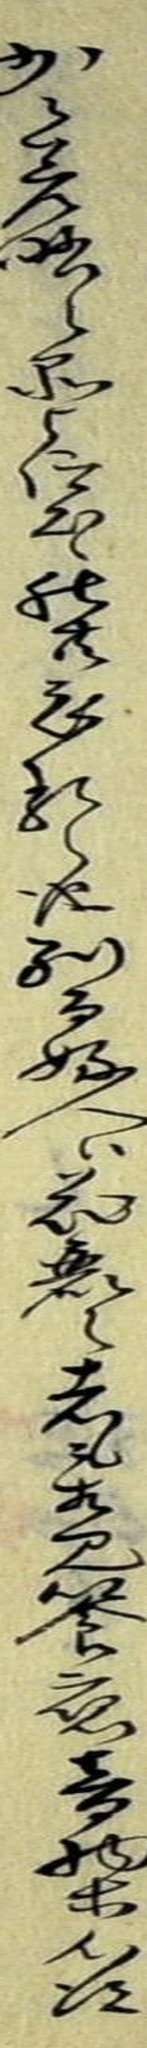少々差略之品被仰出候然共衣類之儀別而婦人は花麗之者も相見饗応音物等心得
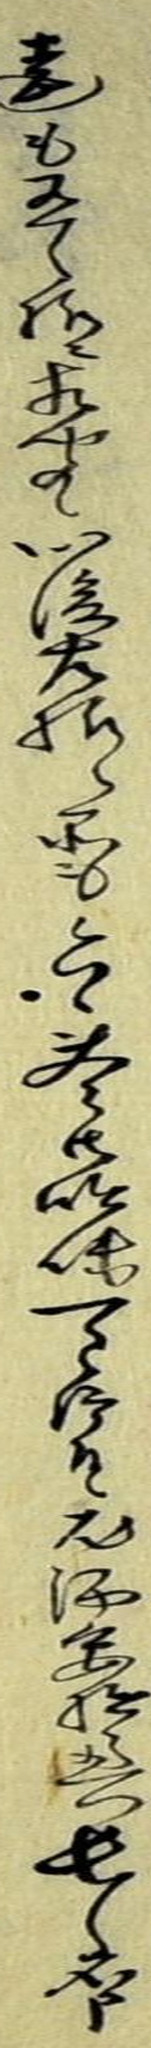違も有之候様に相聞候以後左様之品も候はゝ夫々御吟味可被仰付候尤酒宴遊興長之不
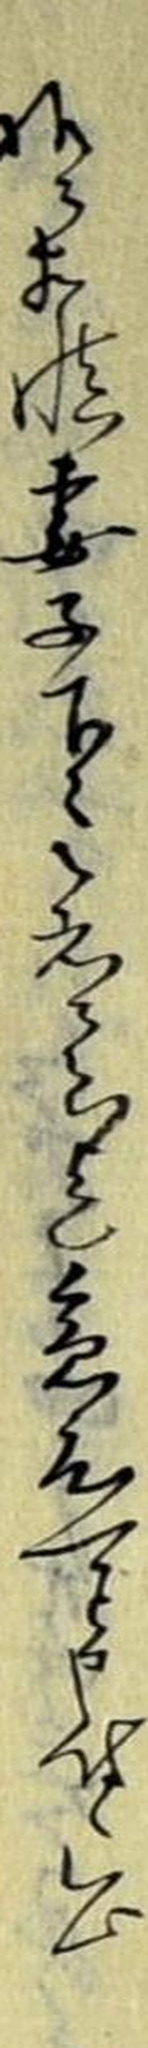様に相慎妻子下々之者に至迄急度可被申付候以上

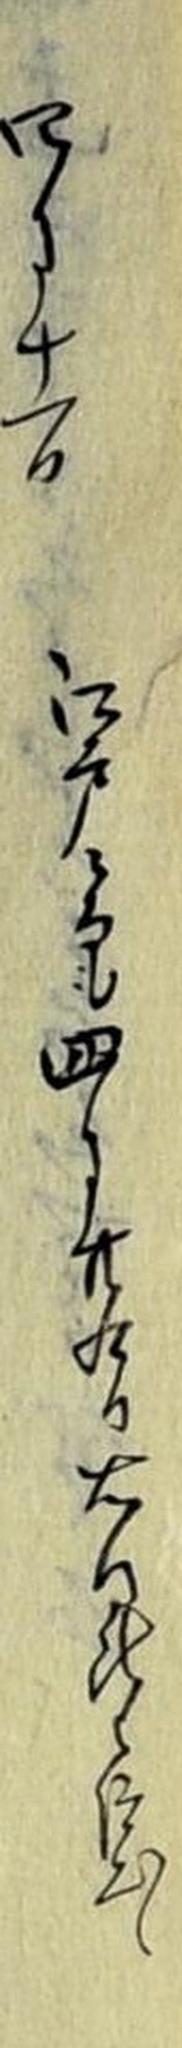四月十一日江戸に而も四月廿九日右同断被仰出候
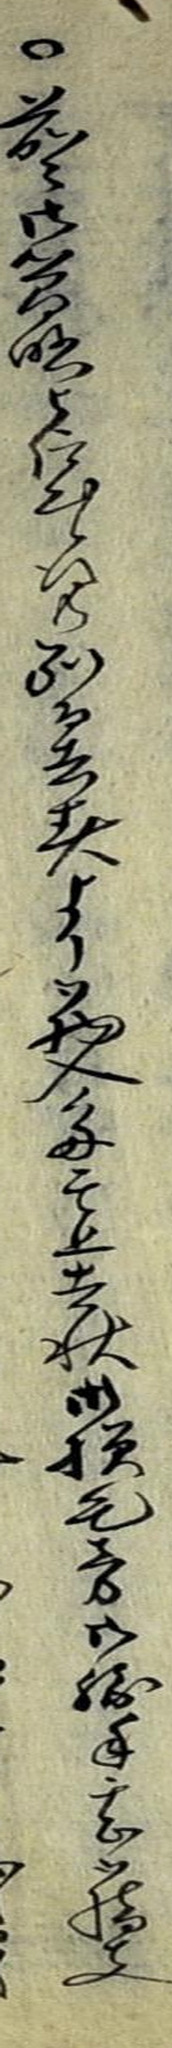〇前々御簡略被仰出候得共別而去春より御物入多其上去秋御損毛旁御勝手甚御指支
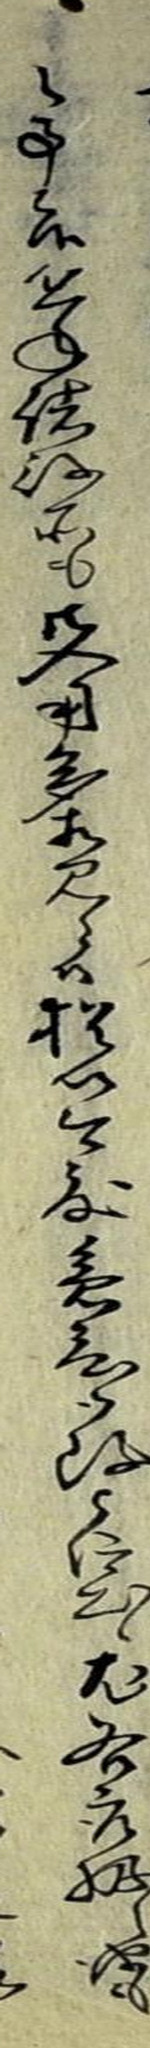之事に候近年諸役所も御入用多相見に付猶以今度急度御改被仰出候尤各取扱之儀も
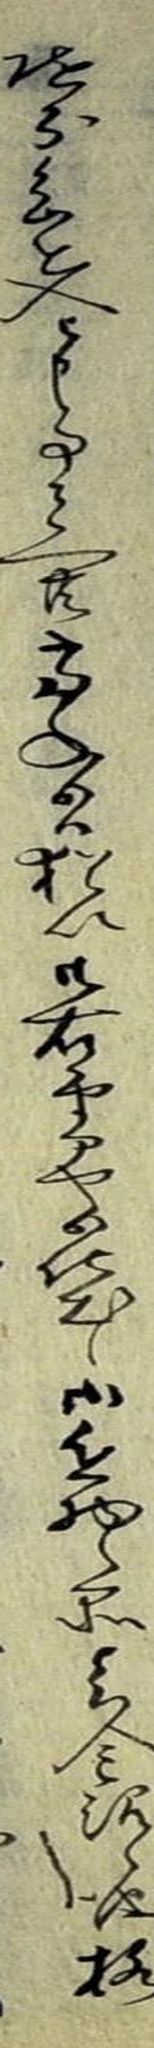随分念を入被申事に候へ共当年ゟは猶以御右筆部ヤゟ仕出候御進物之品々之金銀之儀格
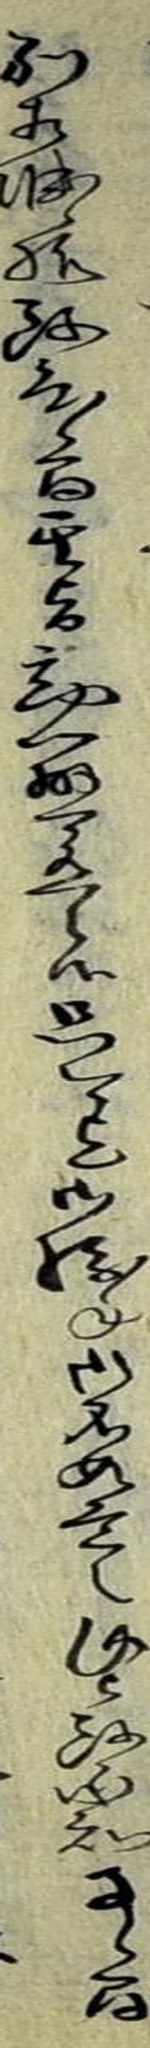別相減候様致度候間其旨勘弁可有之候只今迄御勝手不如意之趣被致承知事候間
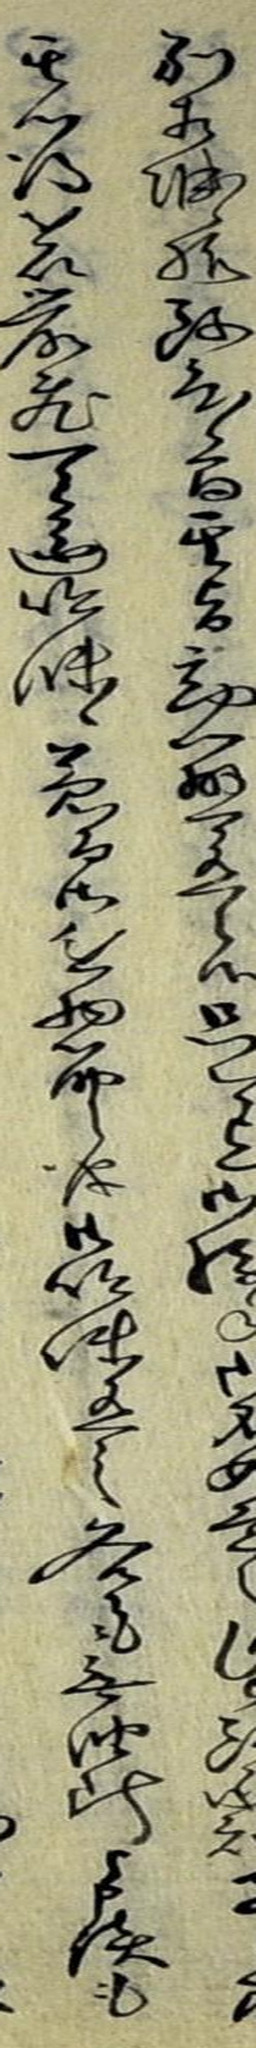其心得を以厳敷可被遂吟味候兼而御進物筋之儀御吟味有之各にも無油断被申談も
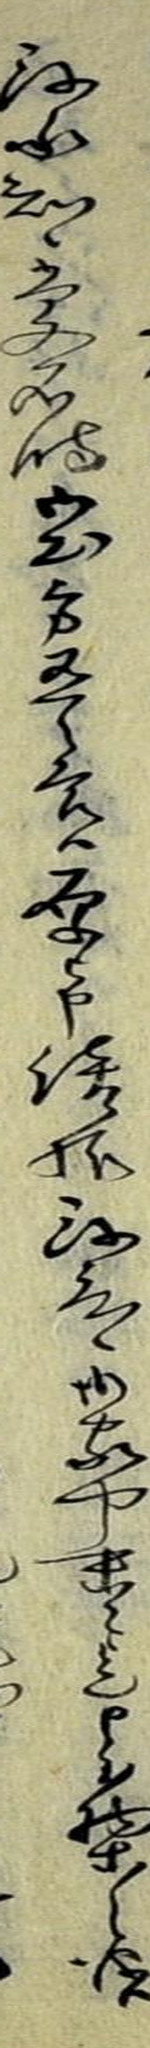致承知候尚又不時御出方有之節は厚被申談候様致度候御家中末々迄申被下物等之儀は
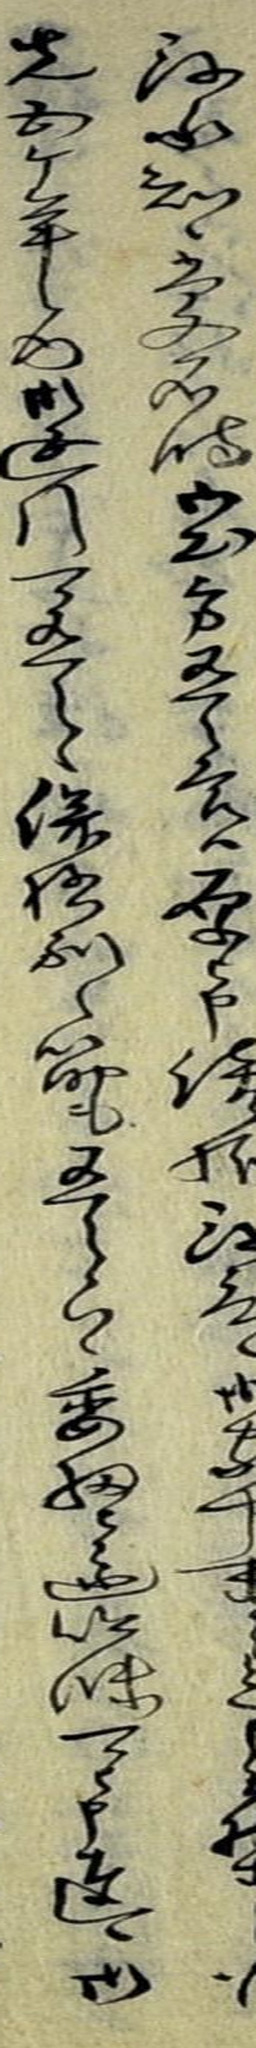先五ヶ年之内御延引可有之候併格別之筋も有之候はゝ委細被遂吟味可被申達候御
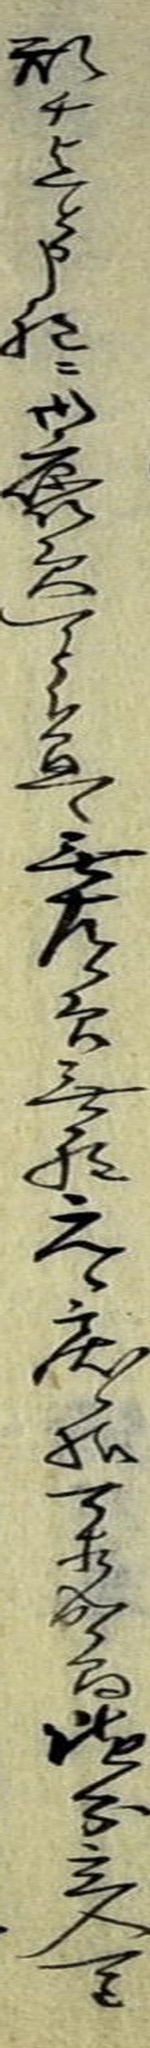形ち迄と申程に御褒美可被下置候無左候而は無程元へ戻候様可相成候間随分立入可被
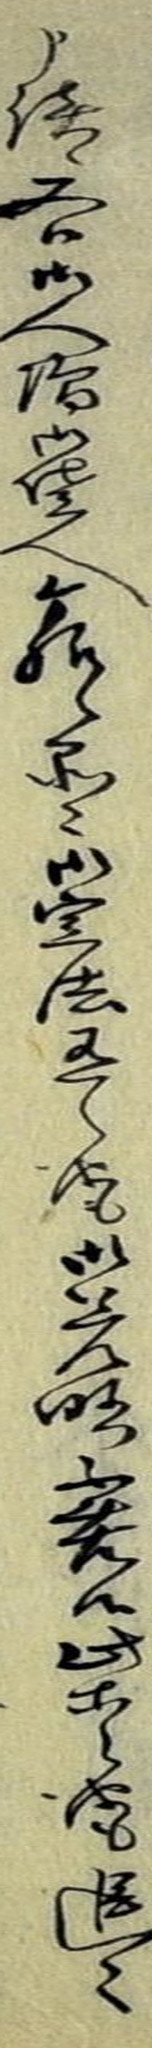申談候又は御人増御貸人ヶ様之品々御定法有之儀も御差略不苦候此等之儀も追々
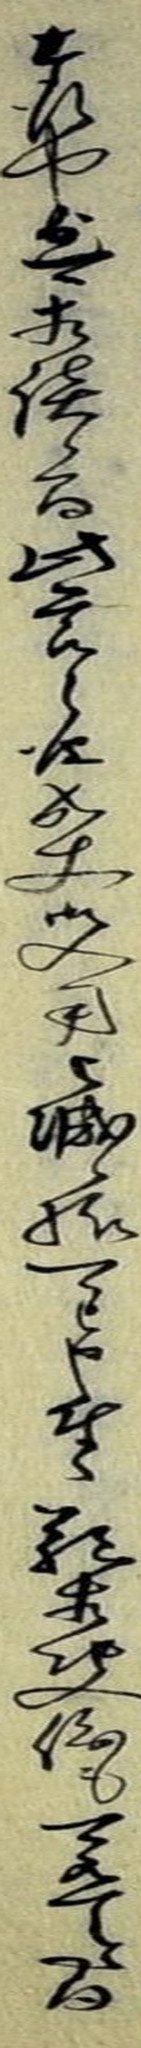奉行中ゟ可相談候間此節之儀成丈御入用被減候様可被申付候難相決儀も可有之候間
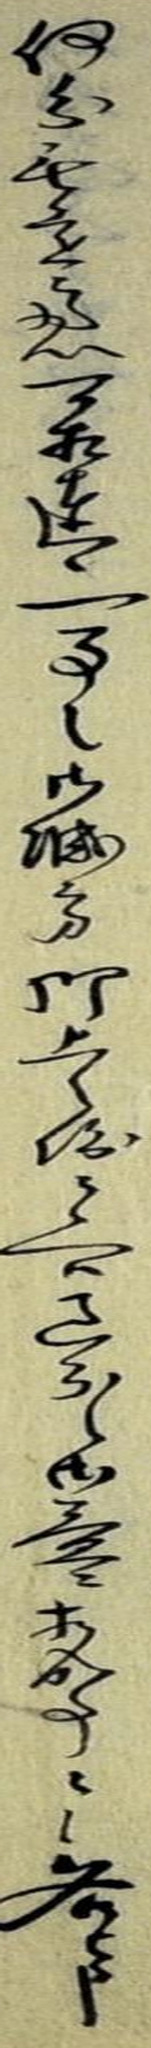何分無遠慮可相達候一事之御減方御上之儀に候へは過分之御益に相成事に候各被申
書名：命令之部 二
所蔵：福井県文書館 Fukui Prefectural Archives
